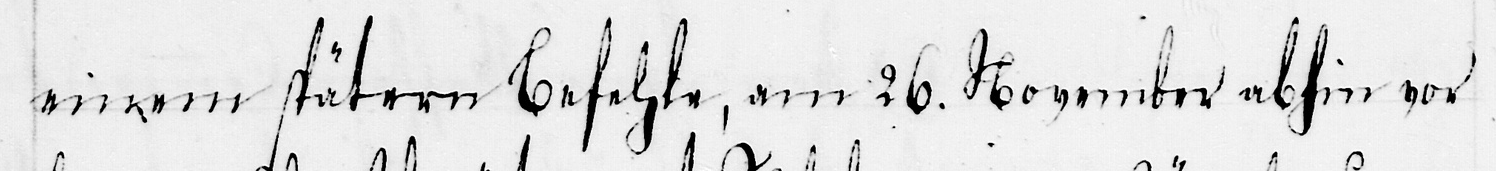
einem spätern Befehle, am 26. November abhin vor
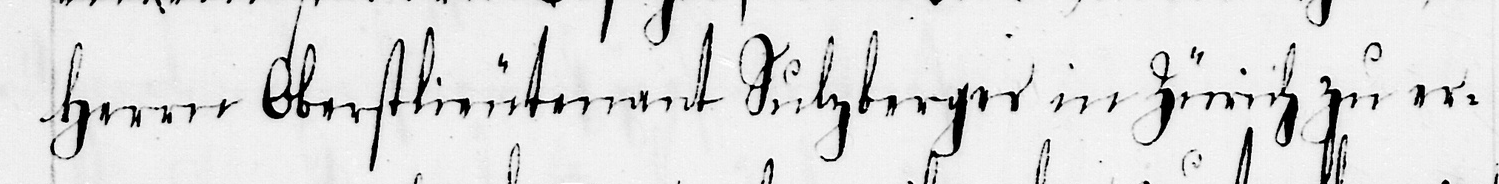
Herrn Oberstlieutenant Sulzberger in Zürich zu er¬
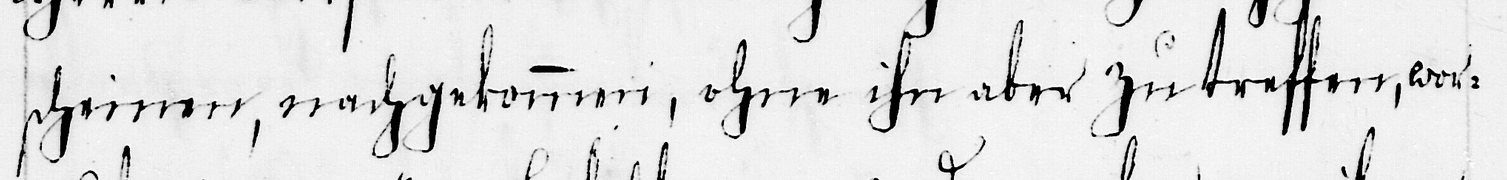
scheinen, nachgekommen, ohne ihn aber zu treffen, wor¬
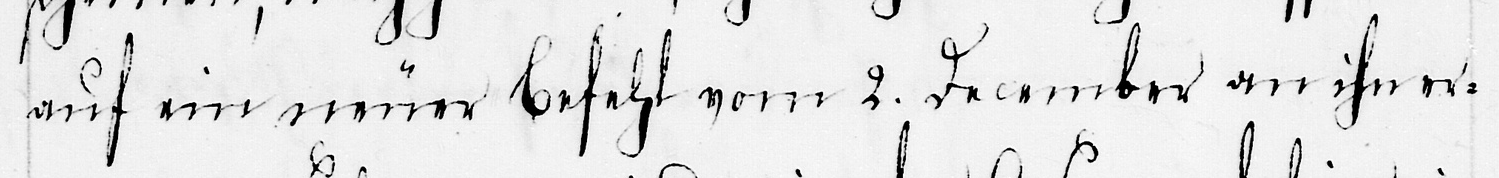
auf ein neuer Befehl vom 2. December an ihn er¬
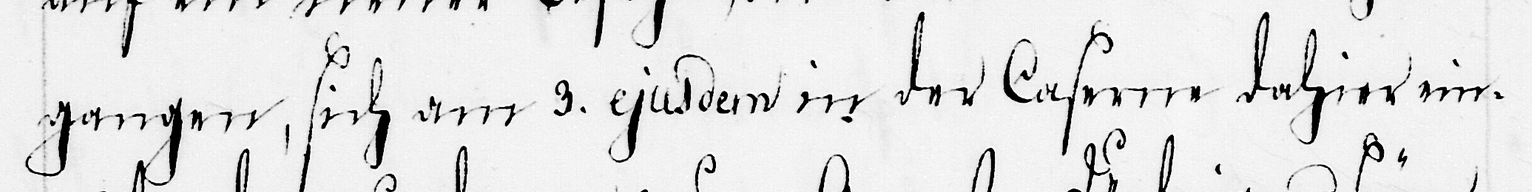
gangen, sich am 3. ejusdem in der Caserne dahier ein¬
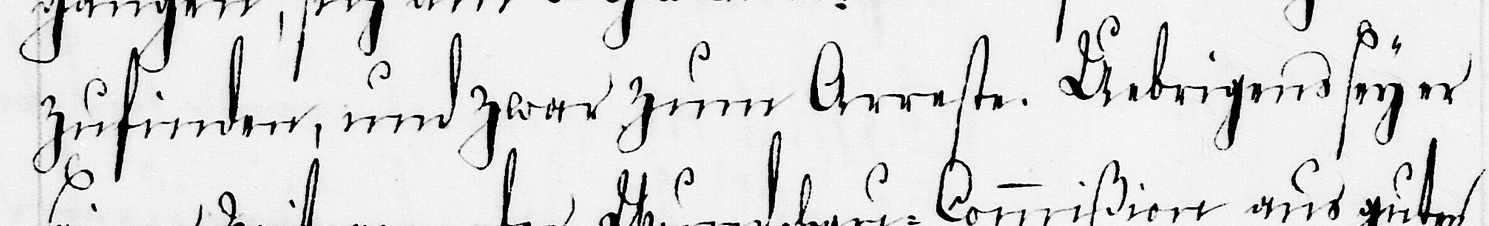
zufinden, und zwar zum Arreste. Uebrigens sey er
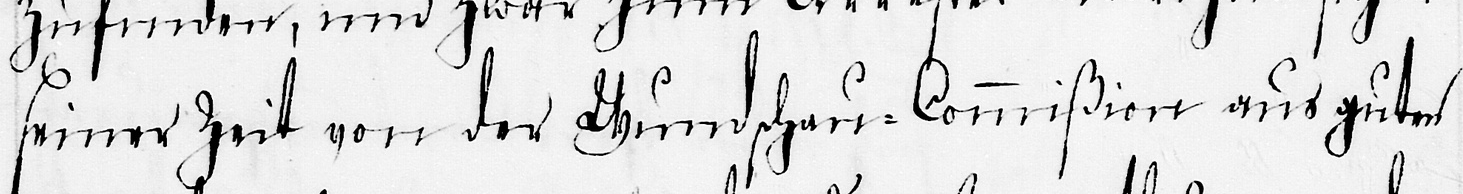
seiner Zeit von der Wundschau-Commißion aus guten
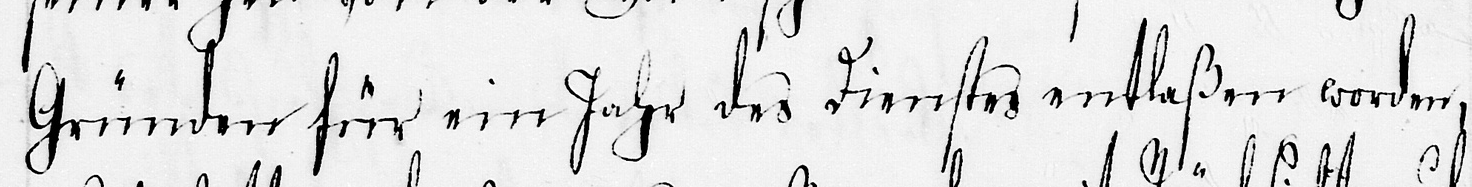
Gründen für ein Jahr des Dienstes entlaßen worden,
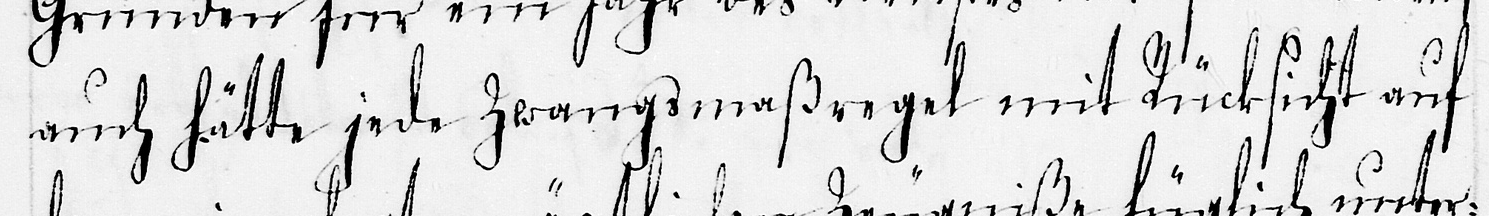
auch hätte jede Zwangsmaßregel mit Rücksicht auf
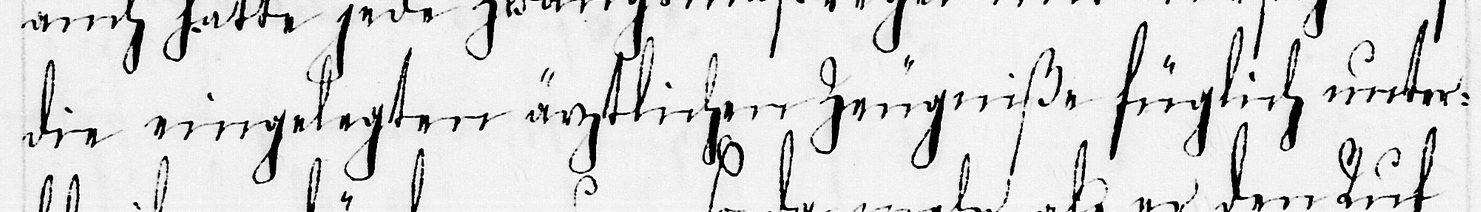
die eingelegten ärztlichen Zeugniße füglich unter¬
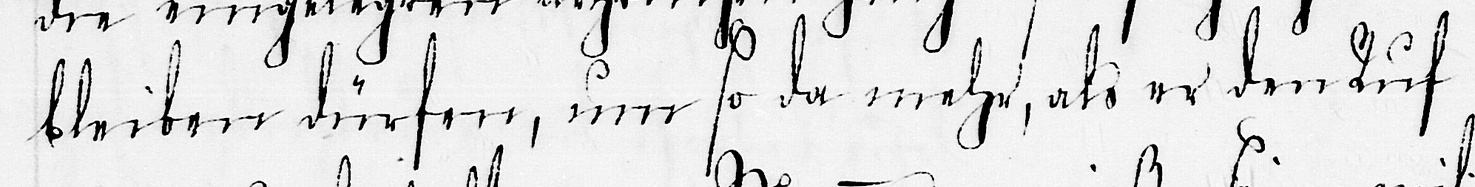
bleiben dürfen, um so da mehr, als er den Ruf
